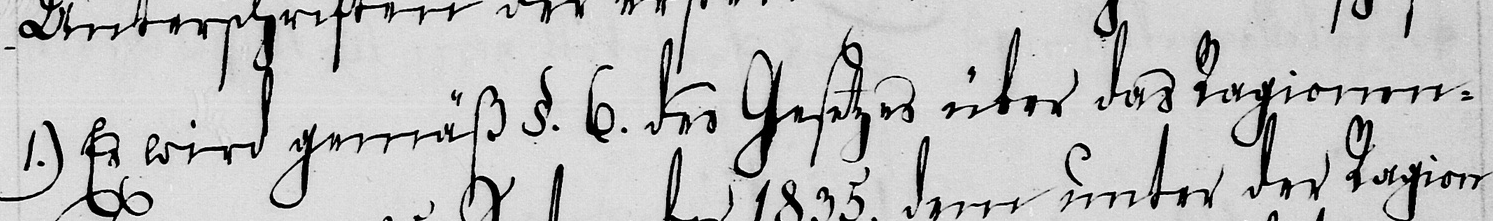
1.) Es wird gemäß §. 6. des Gesetzes über das Ragionen¬
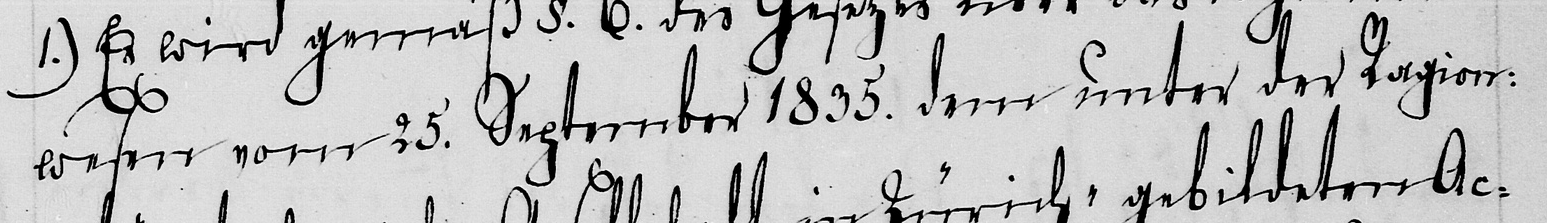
wesen vom 25. September 1835. dem unter der Ragion:
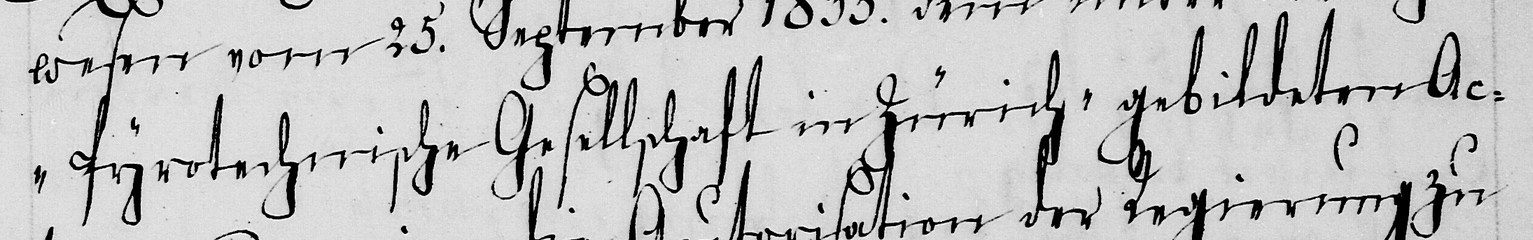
„Pyrotechnische Gesellschaft in Zürich“ gebildeten Ac¬
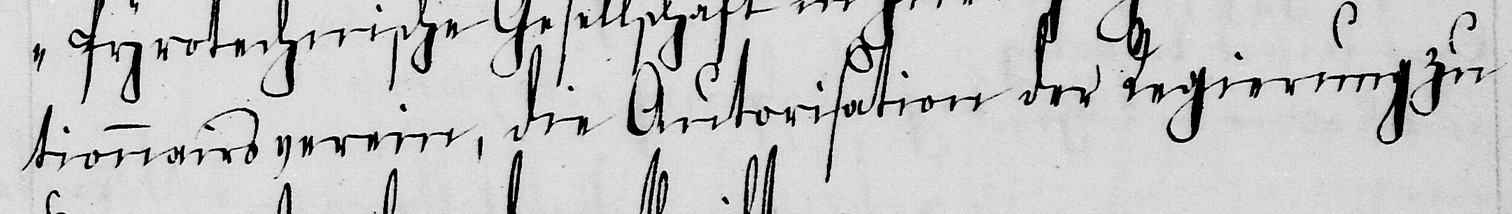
tionnairsverein, die Autorisation der Regierung zu
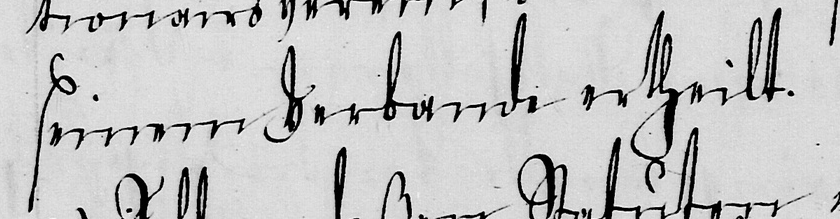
seinem Verbande ertheilt.
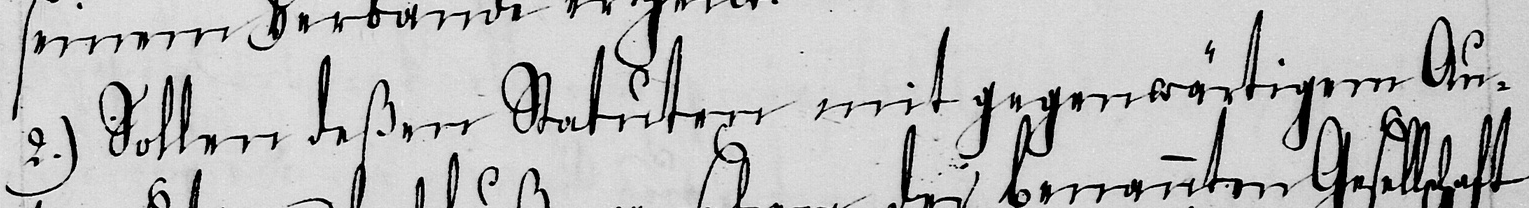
2.) Sollen deßen Statuten mit gegenwärtigem Au¬
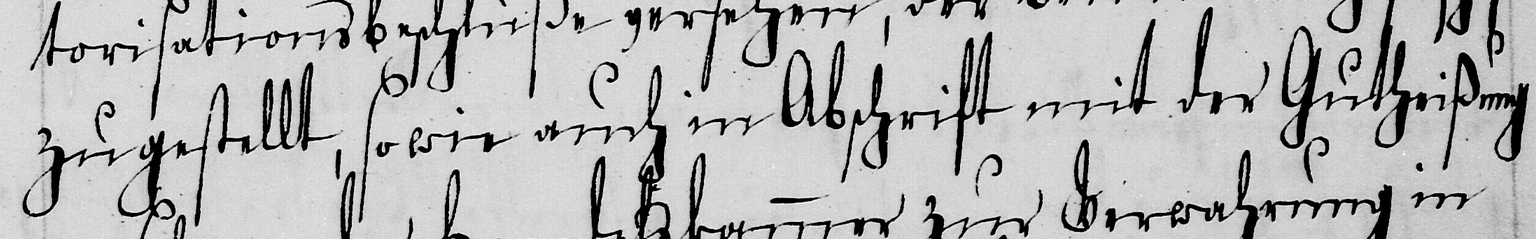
zugestellt, sowie auch in Abschrift mit der Gutheißung
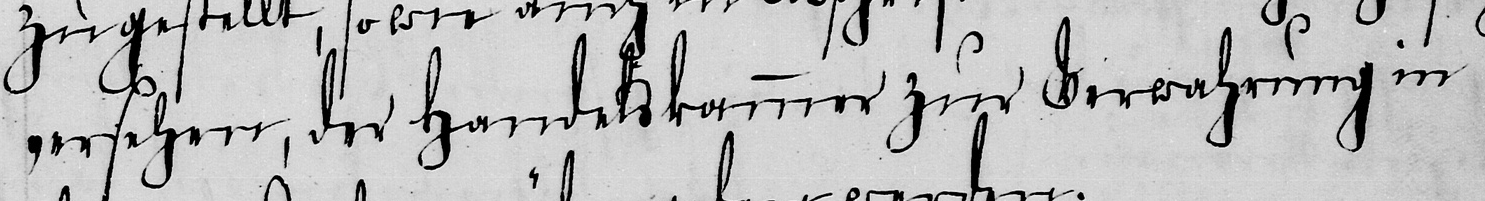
versehen, der Handelskammer zur Verwahrung in
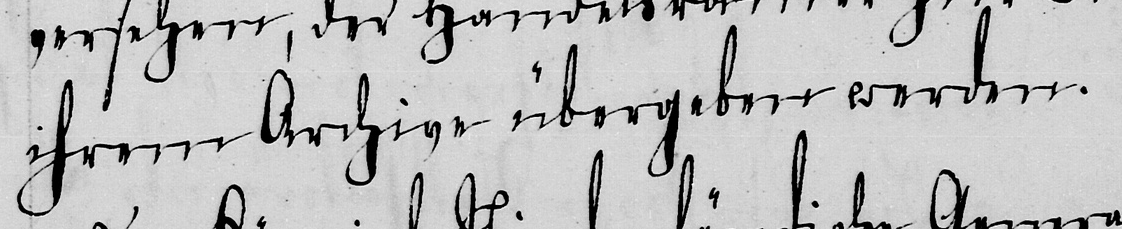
ihrem Archive übergeben werden.
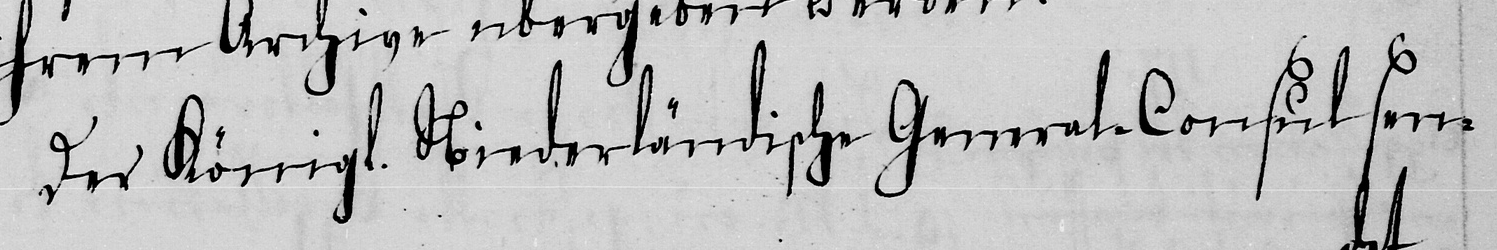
Der Königl. Niederländische General-Consul sen-
